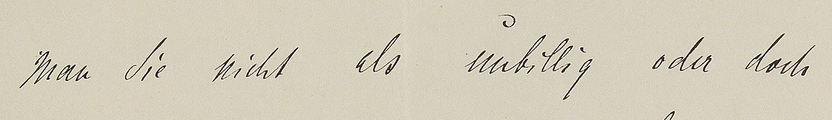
man sie nicht als unbillig oder doch
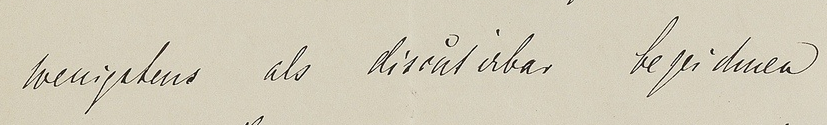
wenigstens als discutirbar bezeichnen
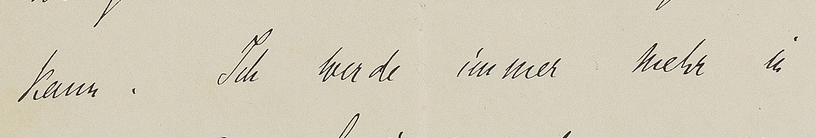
kann. Ich werde immer mehr in
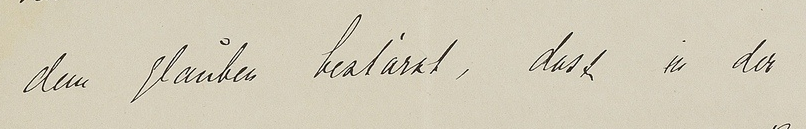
dem Glauben bestärkt, dass in der
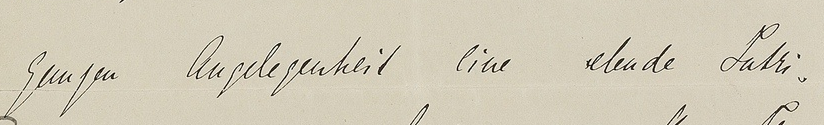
ganzen Angelegenheit eine elende Intri-
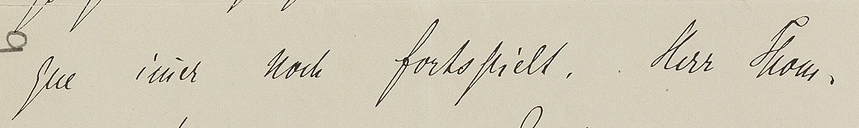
gue immer noch fortspielt. Herr Thom-
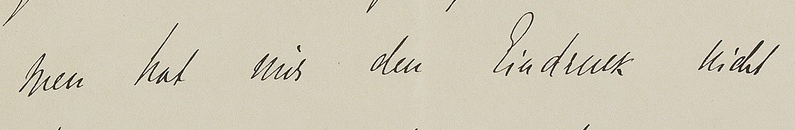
men hat mir den Eindruck nicht
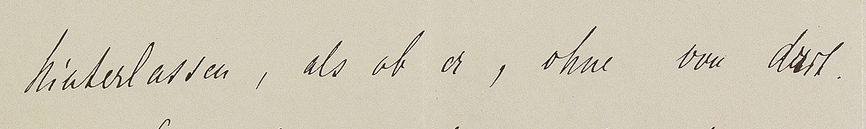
hinterlassen, als ob er, ohne von drit-
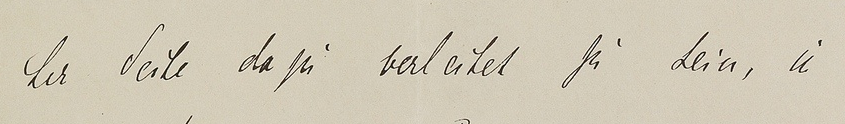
ter Seite dazu verleitet zu sein, in
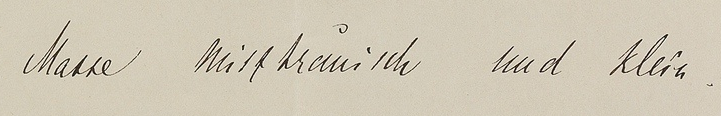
Masse misstrauisch und klein-
